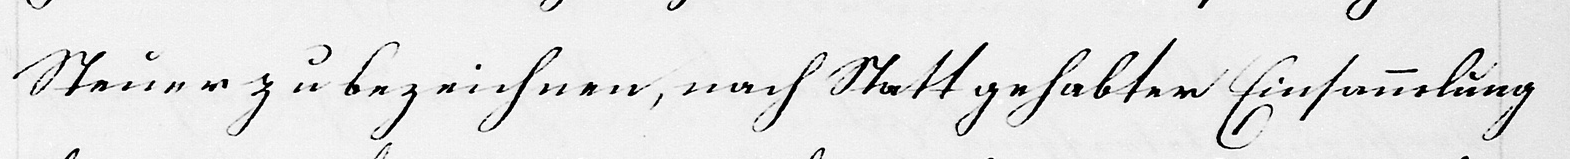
Steuer zu bezeichnen, nach Statt gehabter Einsammlung
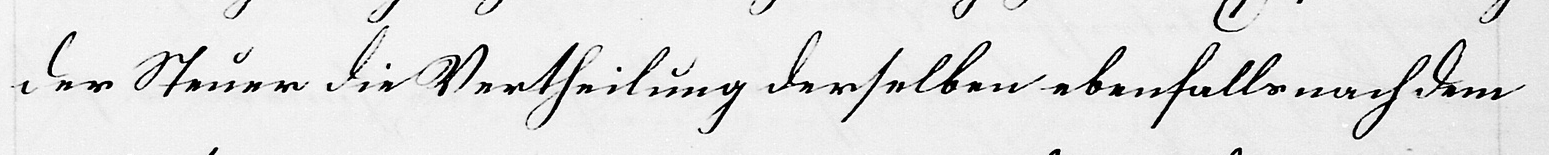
der Steuer die Vertheilung derselben ebenfalls nach dem
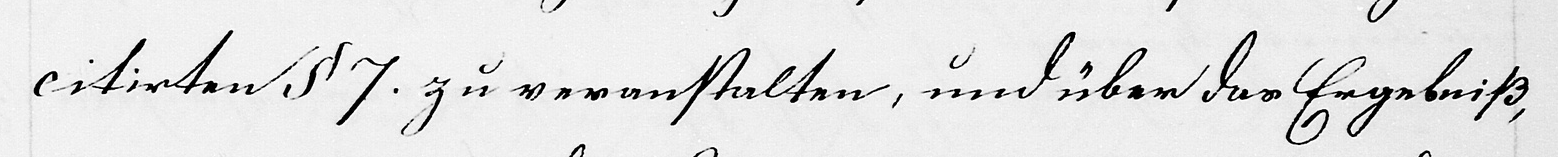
citirten §7. zu veranstalten, und über das Ergebniß,
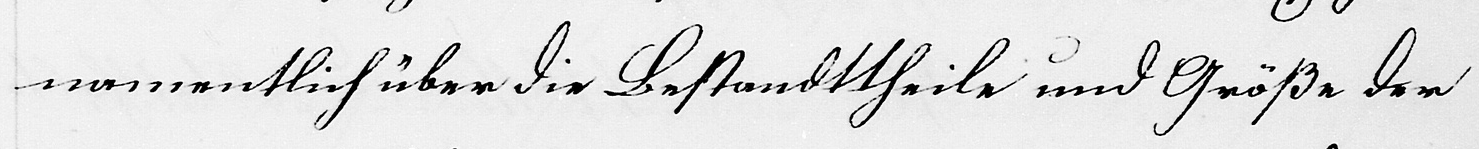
namentlich über die Bestandttheile und Größe der
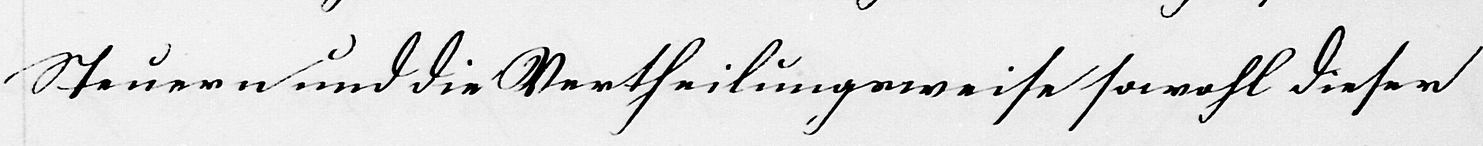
Steuern und die Vertheilungsweise sowohl diesen
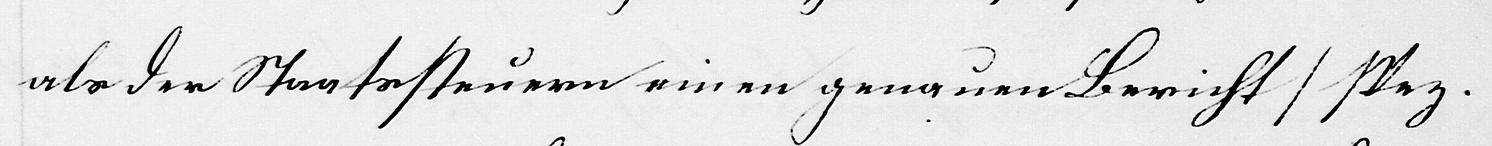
als der Staatssteuer einen genauen Bericht [spez.
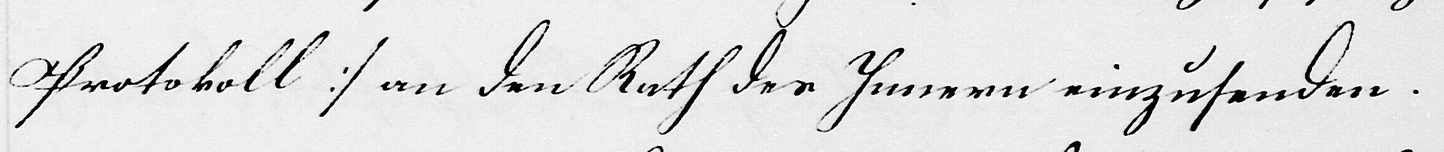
Protokoll] an den Rath des Innern einzusenden.
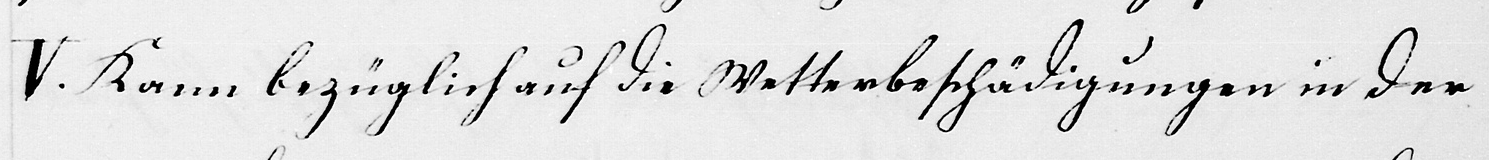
V. Kann bezüglich auf die Wetterbeschädigungen in der
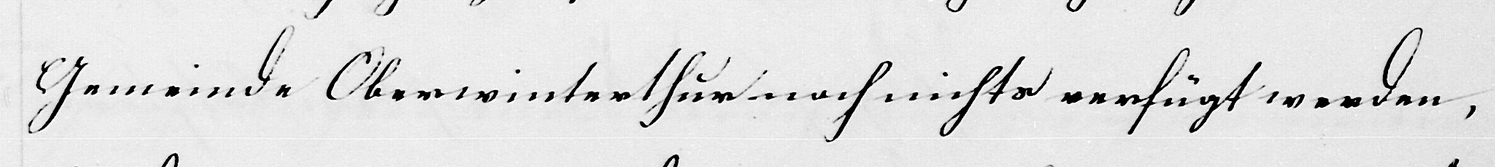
Gemeinde Oberwinterthur noch nichts verfügt werden,
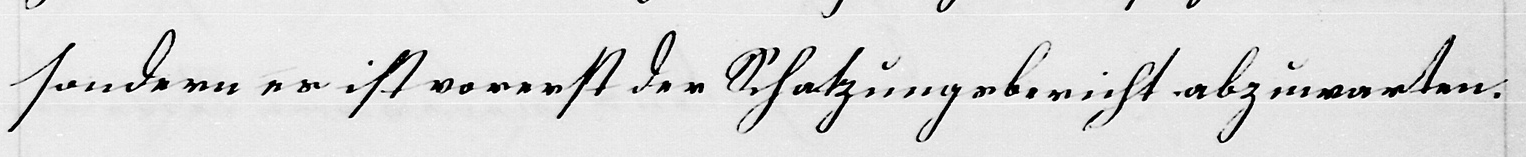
sondern es ist vorerst den Schatzungsbericht abzuwarten.
